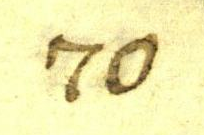70
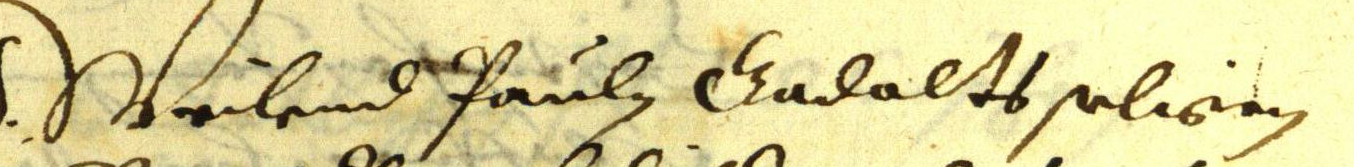Weilend Paūln Gadolts seligen
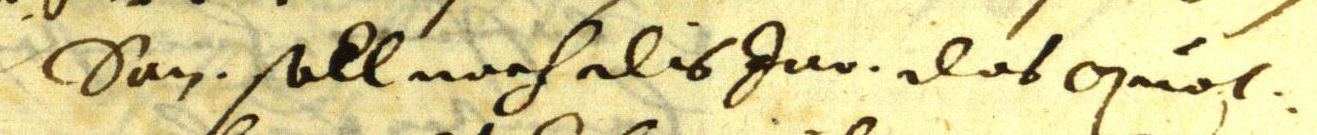Son. soll noch dis Jar. das Qūat¬
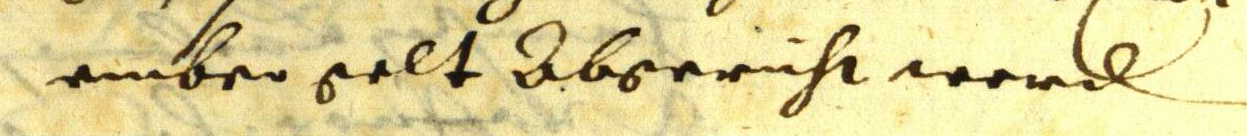ember gelt Abgericht werd
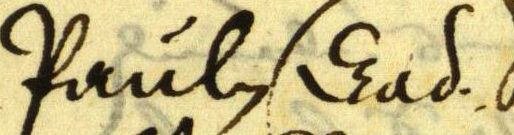Paūln Gad¬
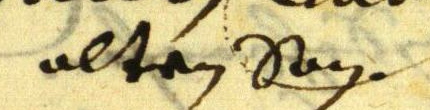olten Son.
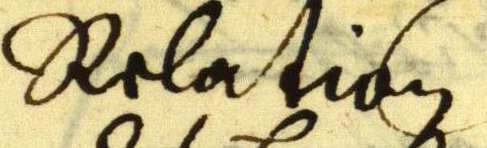Relation
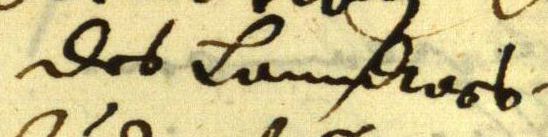des Lanndtags
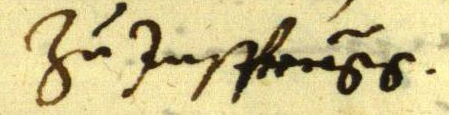Zū InsPrūgg.
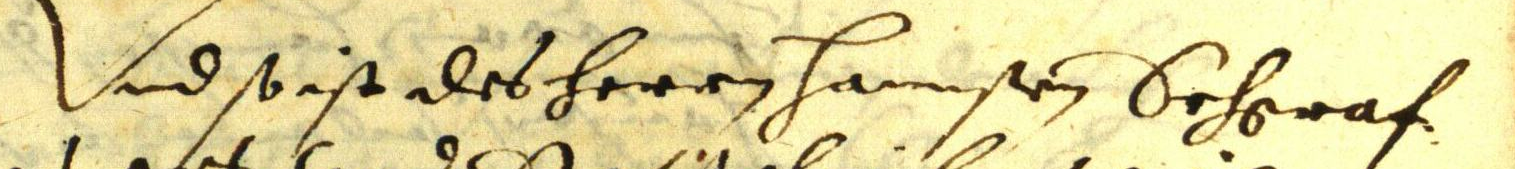Vnd so ist des herrn hannsen Schgraf¬
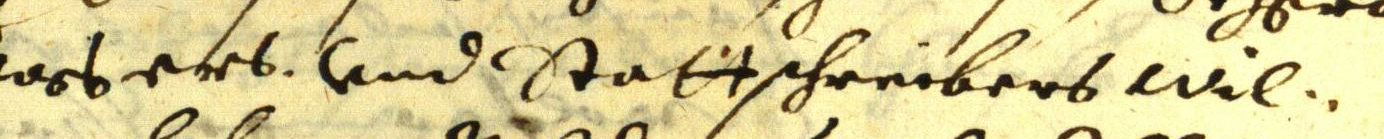ers. vnd Stattschreibers Wil¬
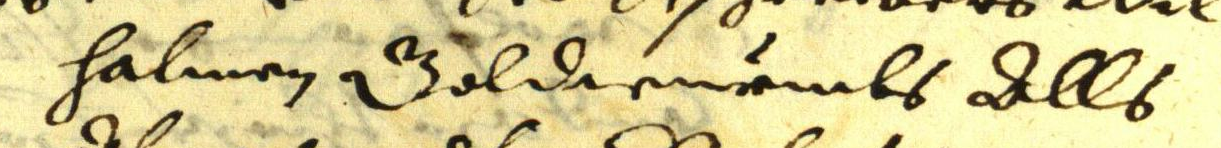halmen Goldwūrmbs Alls
